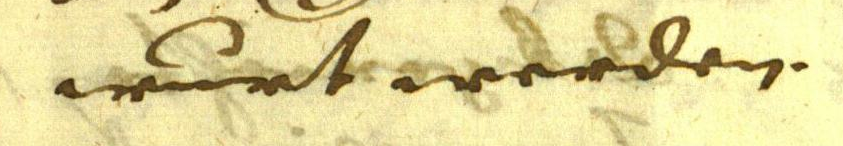wūrt werden.
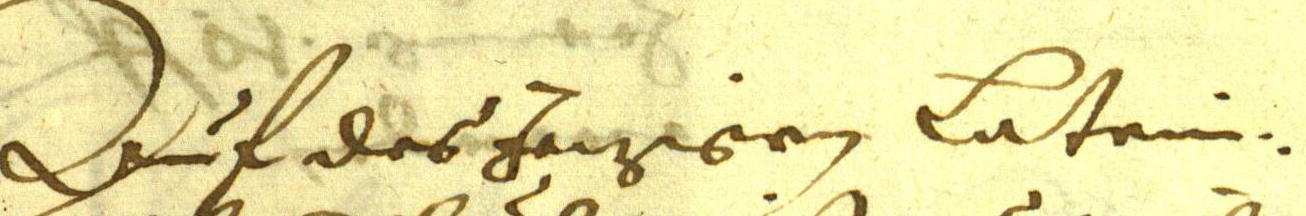Aūf des Jezigen Latein¬
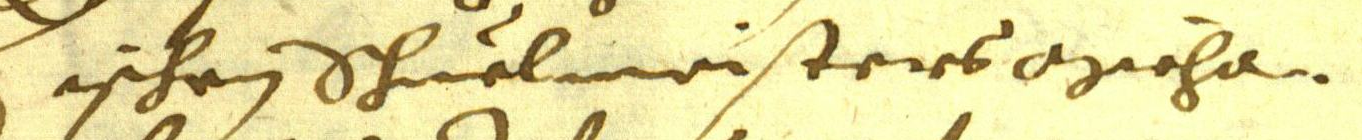ischen Schūelmaisters Micha¬
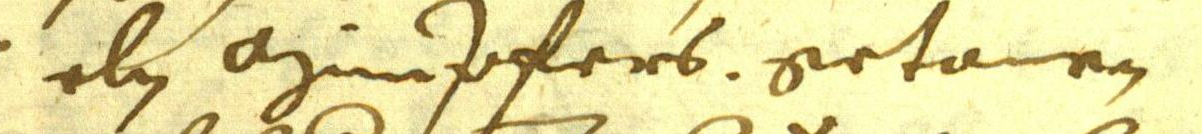eln MimPfers. getanen
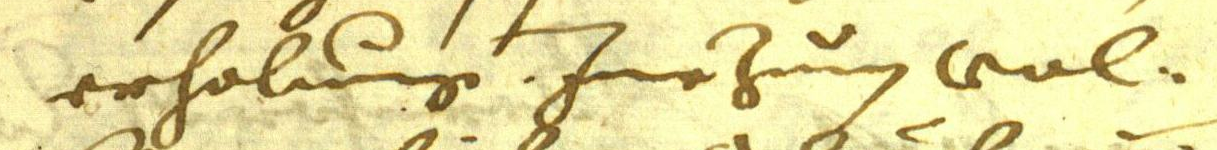erholūng. Ime Zūm vol¬
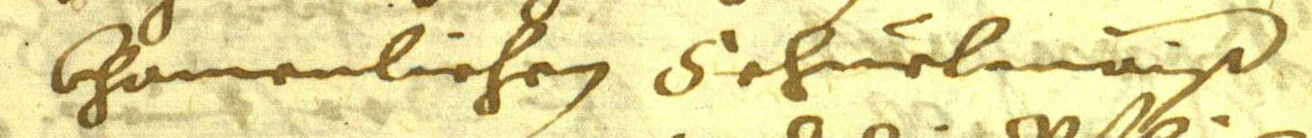khomenlichen Schūelmaist
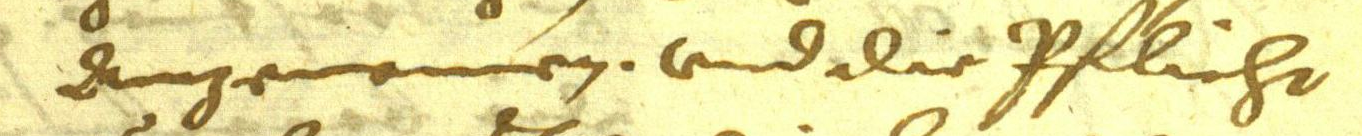Anzenemen. vnd die Pflicht
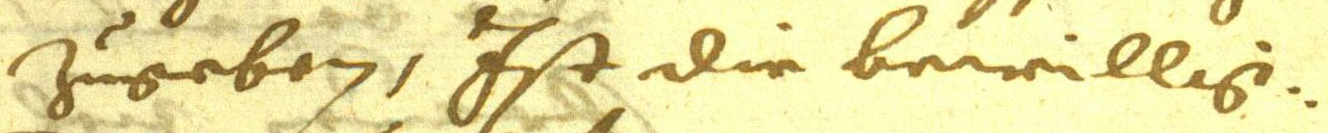Zūgeben, Ist die bewillig¬
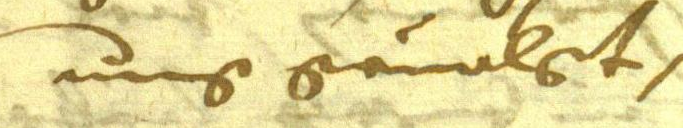ūng geūolgt,
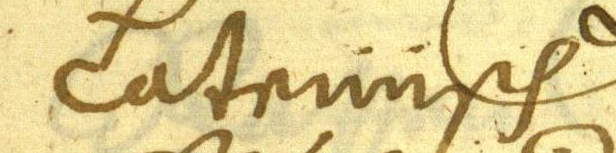Lateinisch
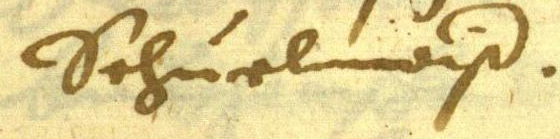Schūelmaist.
